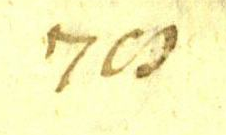78
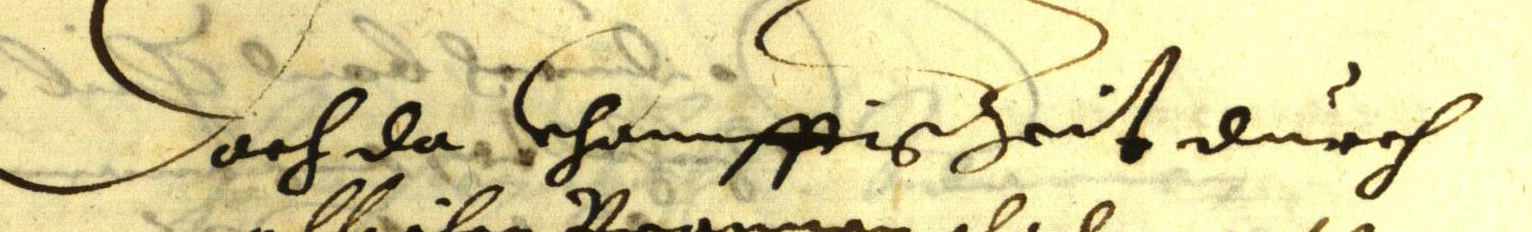Doch da khonnfftigzeit dūrch
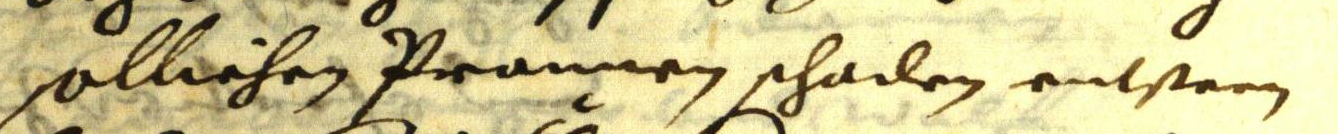sollichen Pronnen schaden entsteen
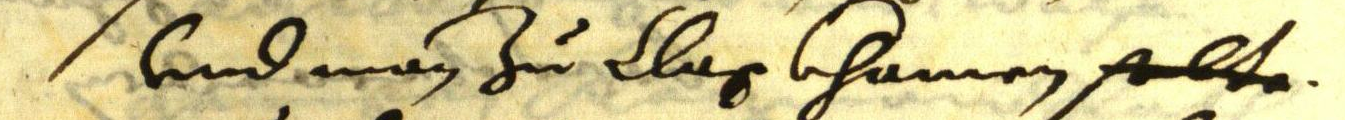vnd man Zū Clag khomen solte.
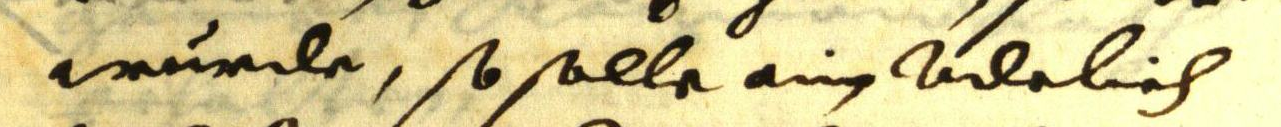wūrde, so solle ain Adelich
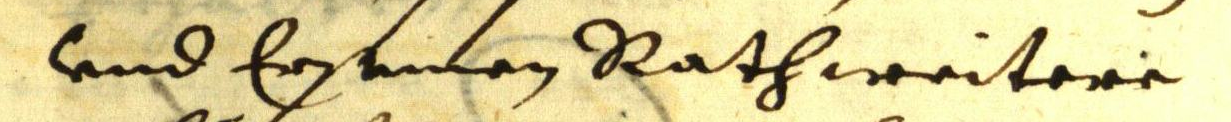vnd Ersamen Rath weiter
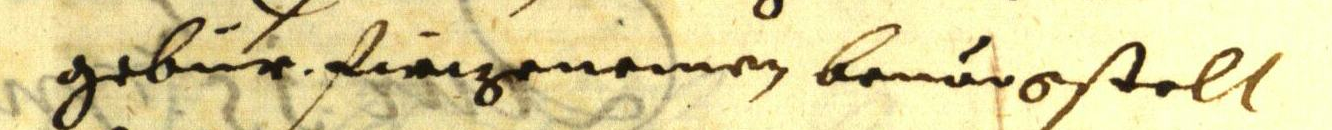gebür. firzenemen beūorgestelt
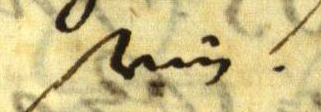sein.
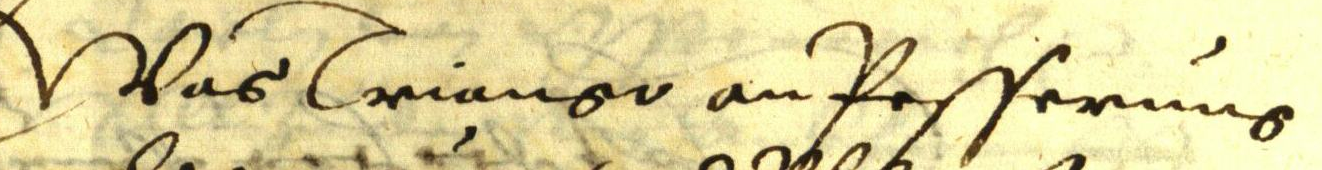Was Triango an Pesserūng
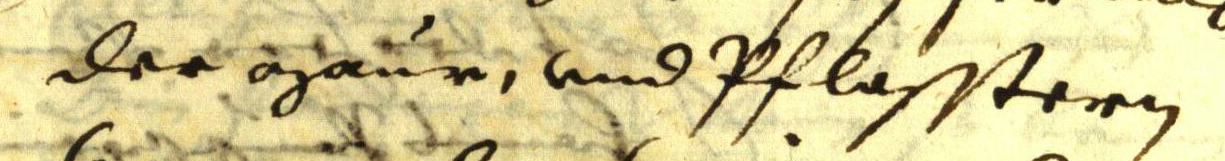der Maūr, vnd Pflasstern
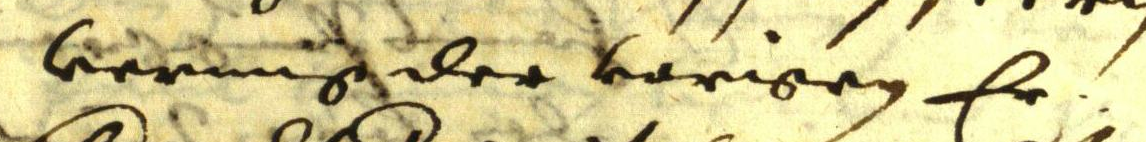vermig der vorigen Er-
